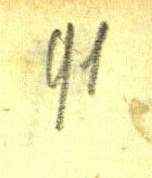91
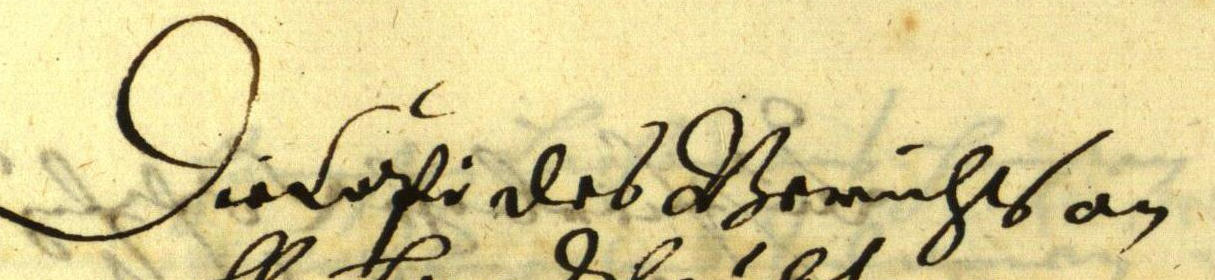Die CoPi des Berichts an
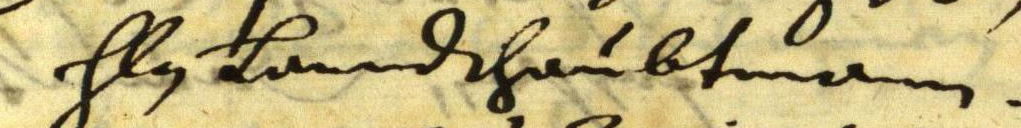hln Lanndthaūbtmann.
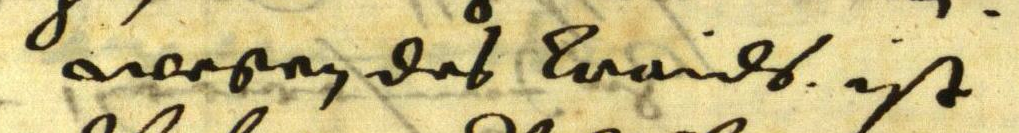wegen des Traids. ist
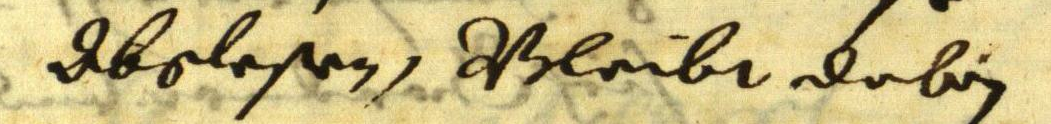Abglesen, Bleibt dabej
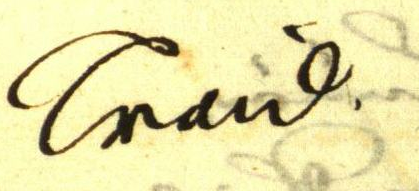Traid.
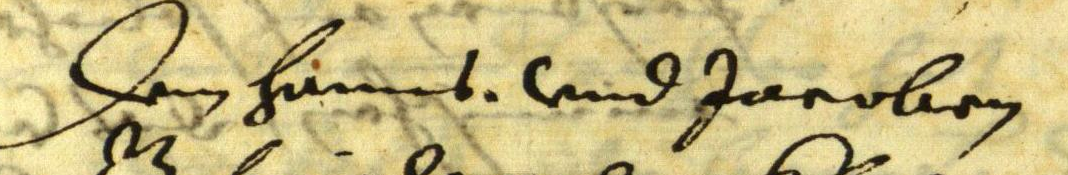Dem hanns. vnd Jacoben
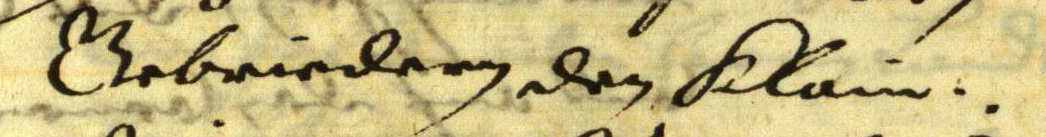Gebriedern den Klain¬
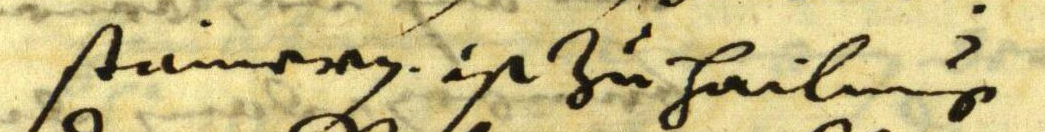stainern. ist Zū Hailūng
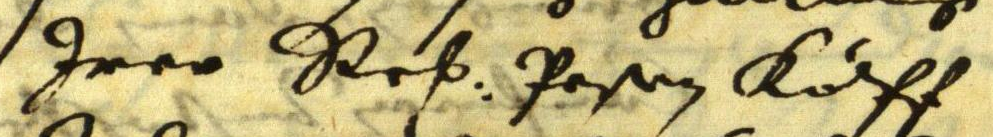Irer Re: Person Kōpf
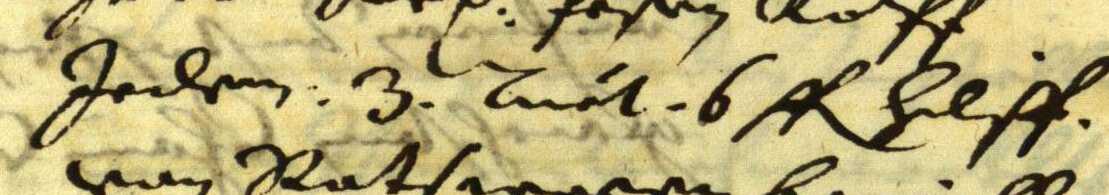Jedem: 3. Tūet .6 fl hilff
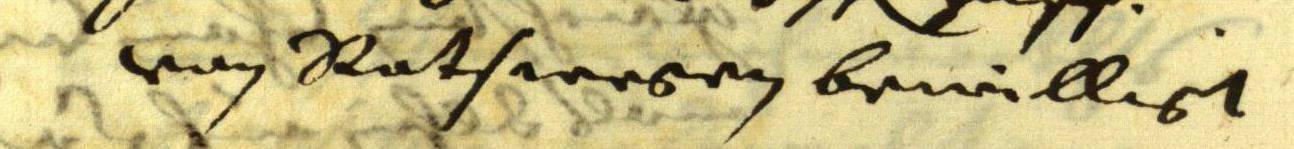von Ratswegen bewilligt
